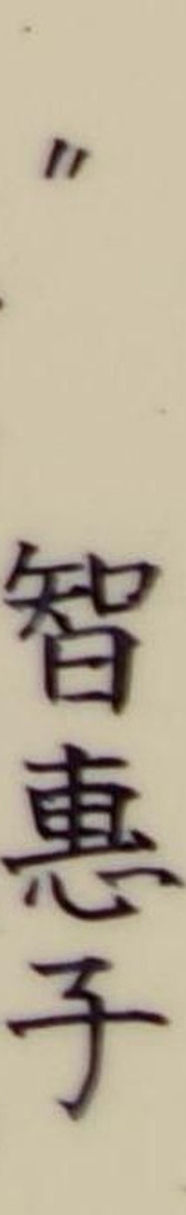智恵子
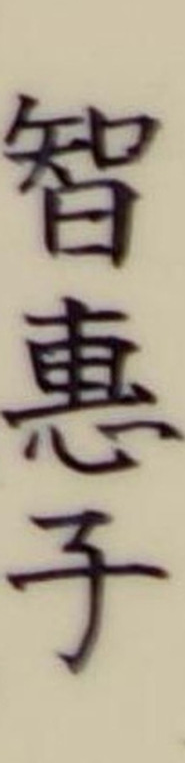智恵子
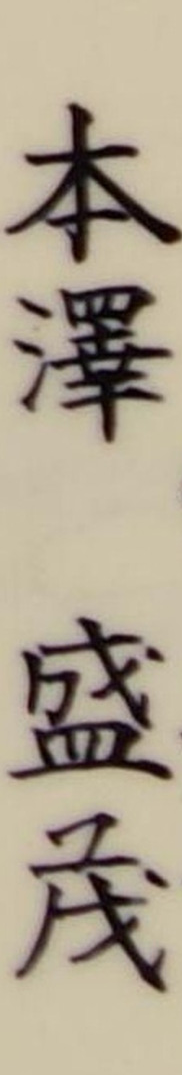本澤盛茂
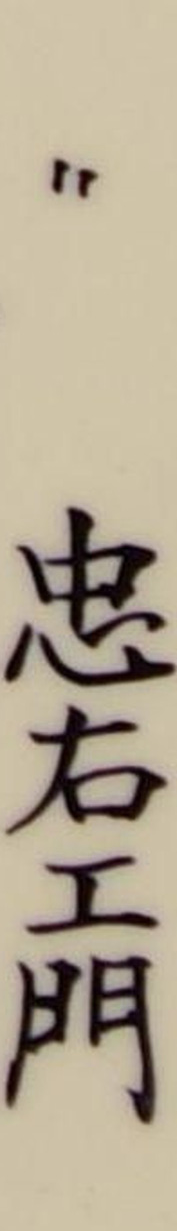忠右エ門
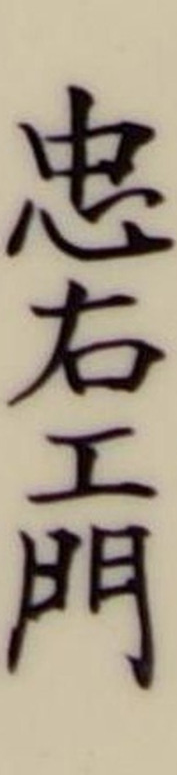忠右エ門
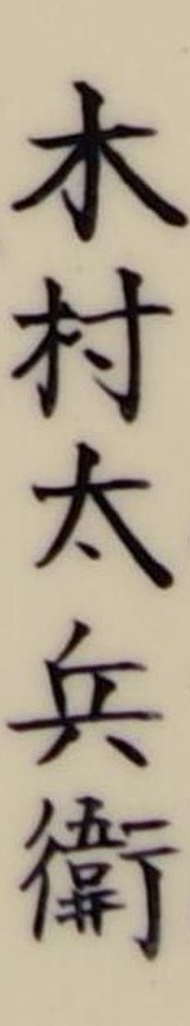木村太兵衛
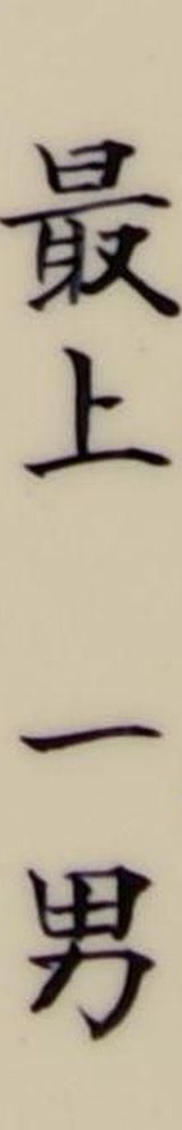最上一男
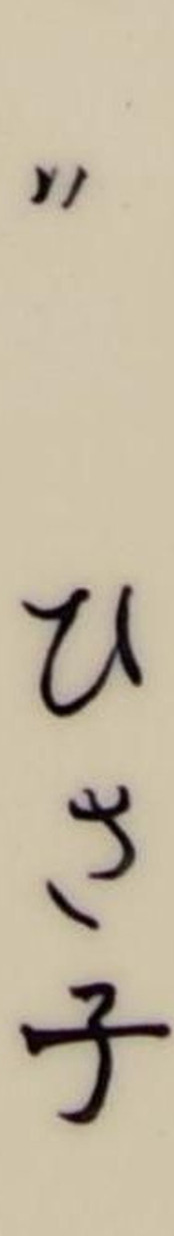ひさ子
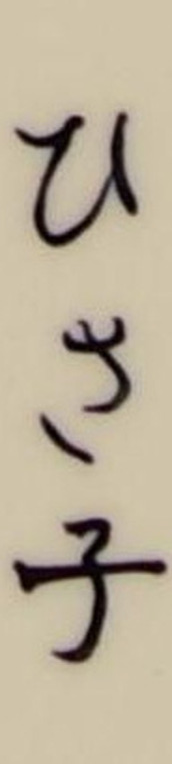ひさ子
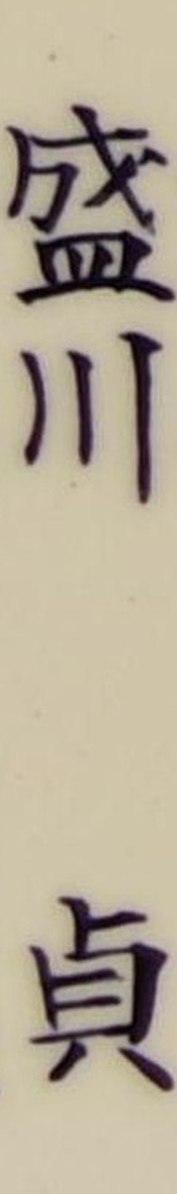盛川貞
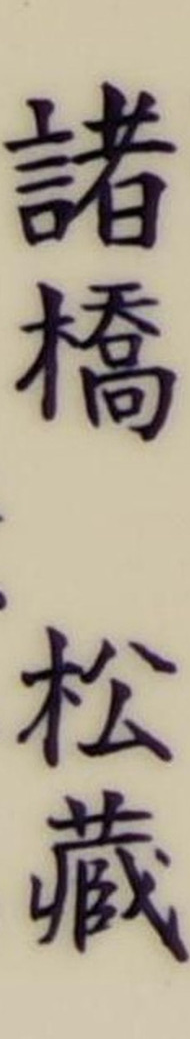諸橋松蔵
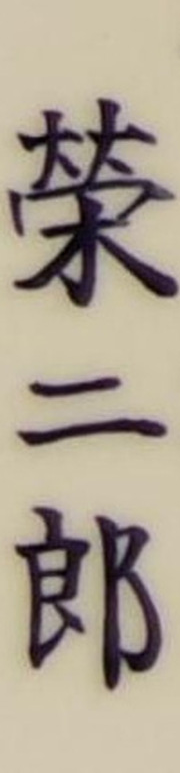榮二郎
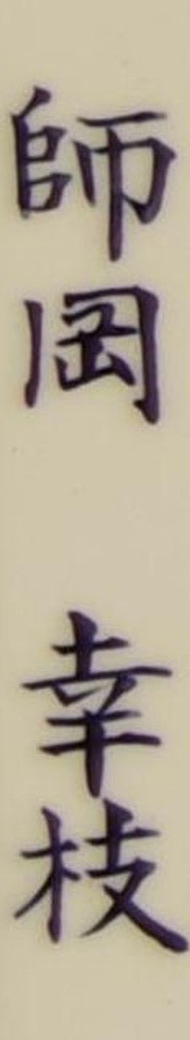師岡幸枝

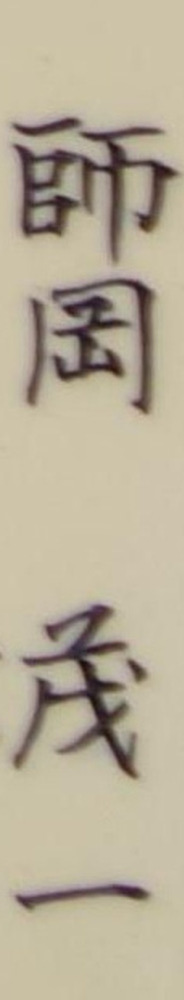師岡茂一
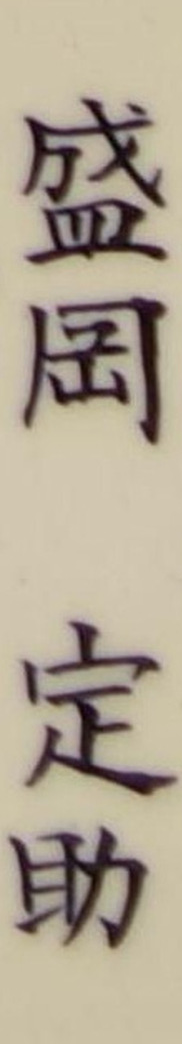盛岡定助
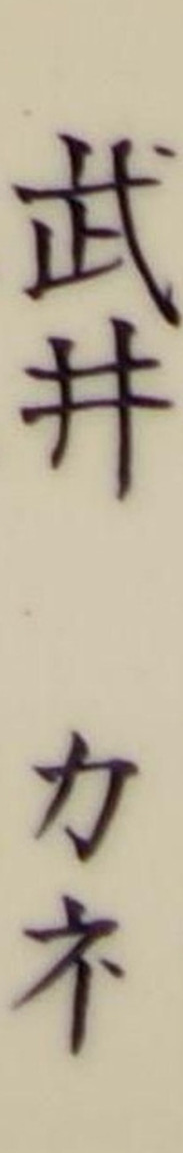武井カネ
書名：E~L
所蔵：高野山金剛峯寺
